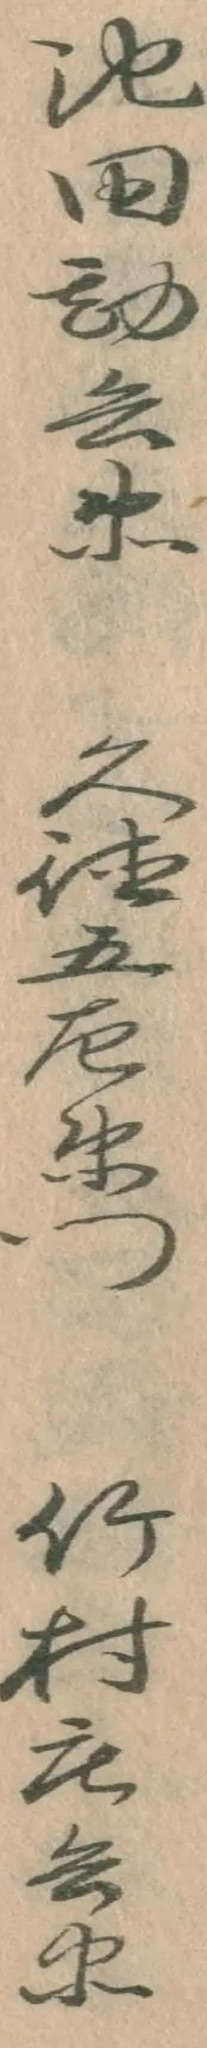池田勘兵衛久徳五左衛門竹村庄兵衛
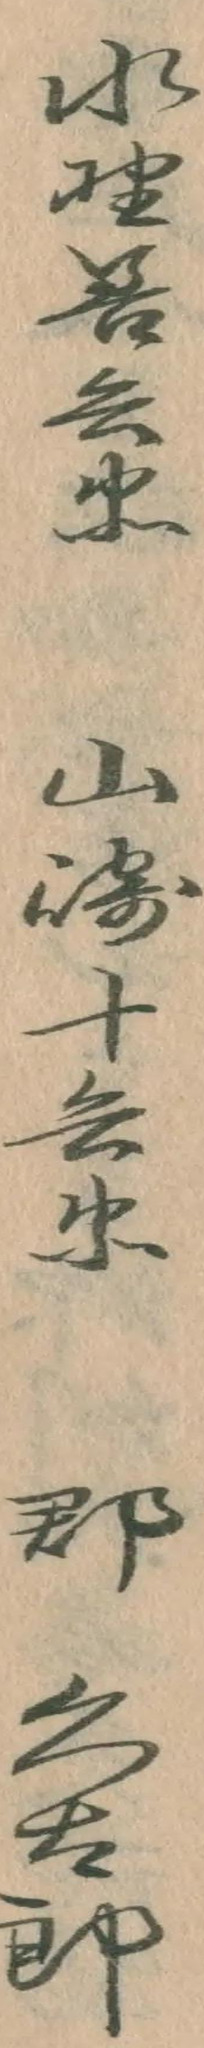水野善兵衛山崎十兵衛郡久太郎
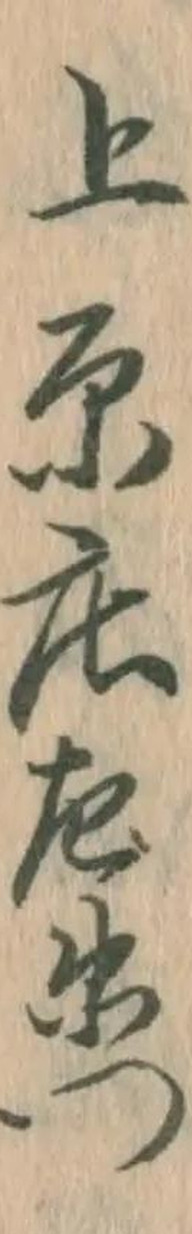上原庄左衛門
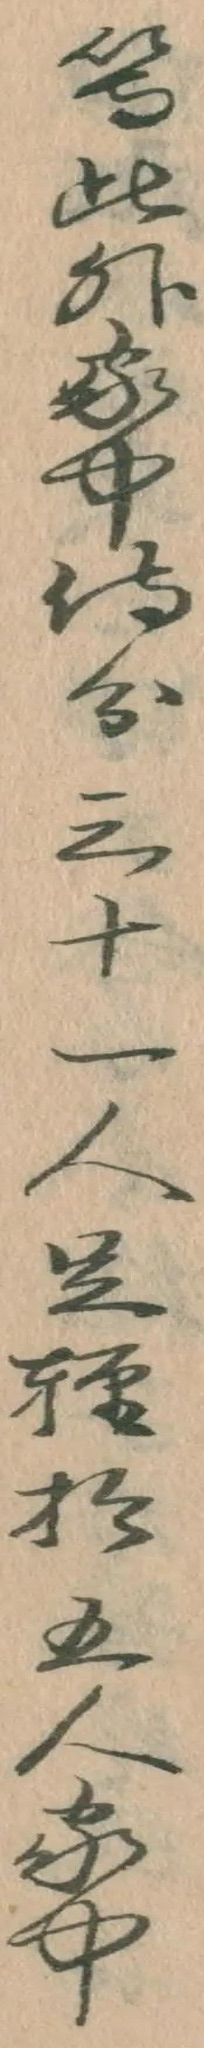等此外家中侍分三十一人足軽拾五人家中
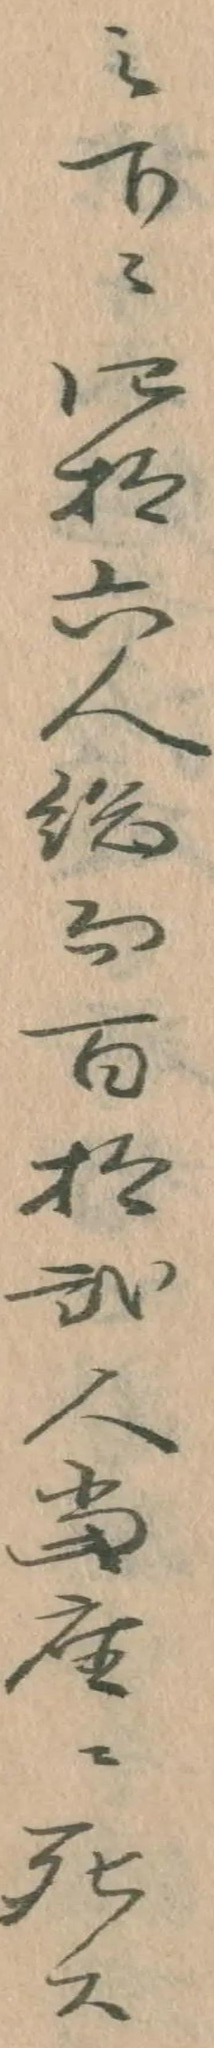之下々四拾六人総而百拾弐人当座に死す
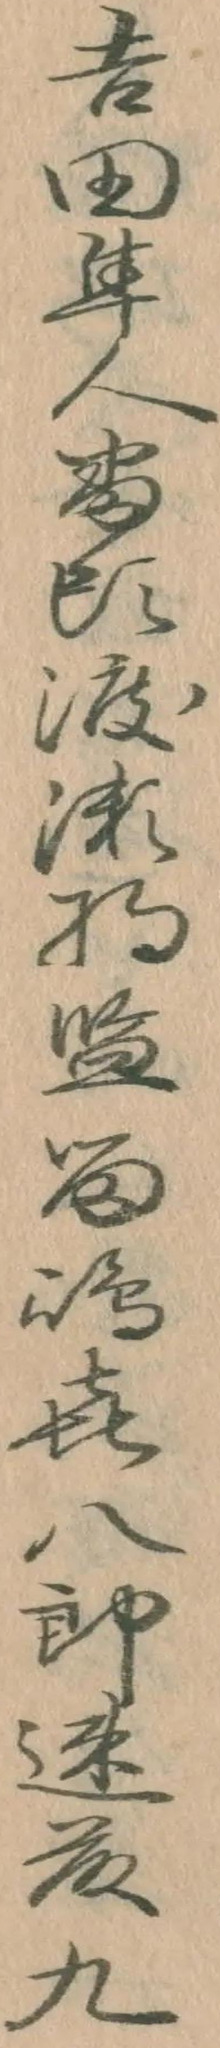吉田隼人番頭渡瀬将監留島喜八郎速藤九
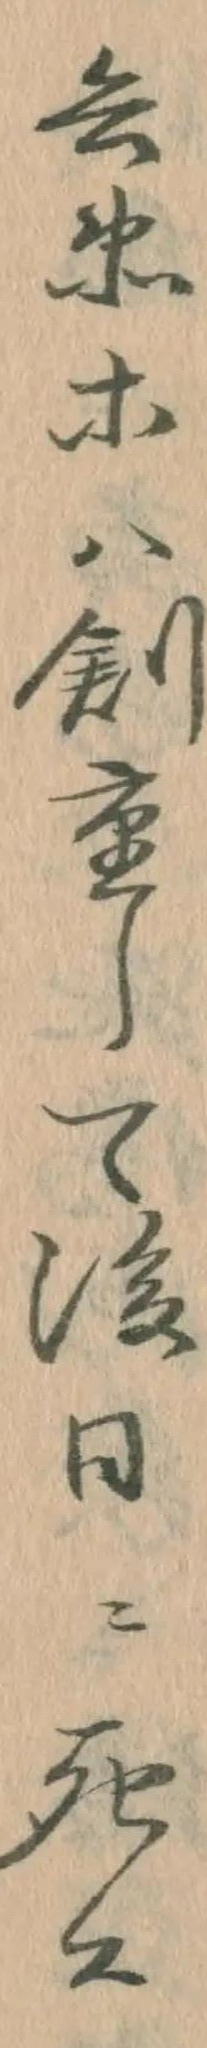兵衛等は創重して後日に死す
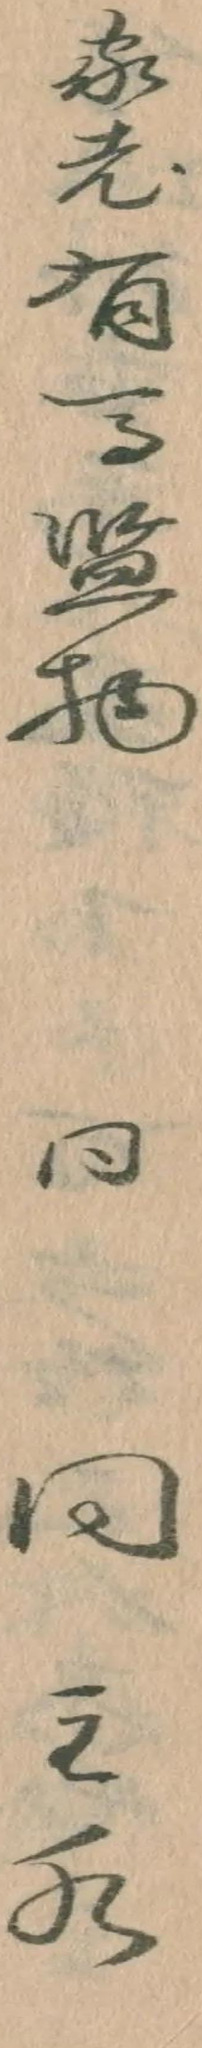家老有馬監物同同主水
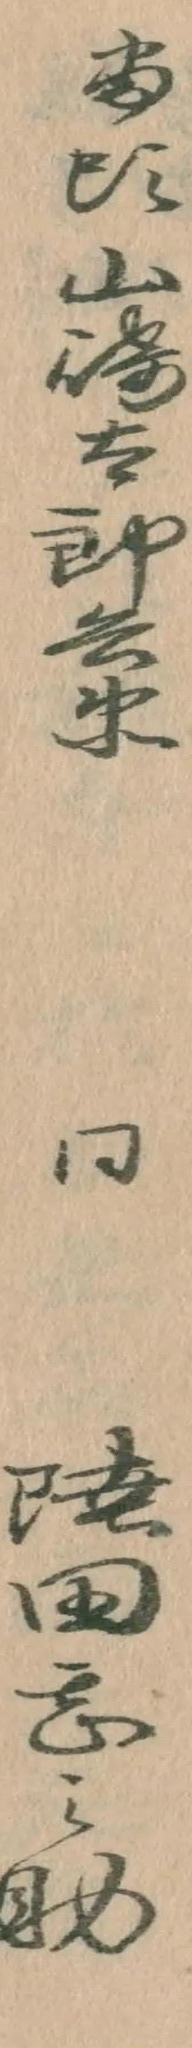番頭山崎太郎兵衛同陸田甚之助
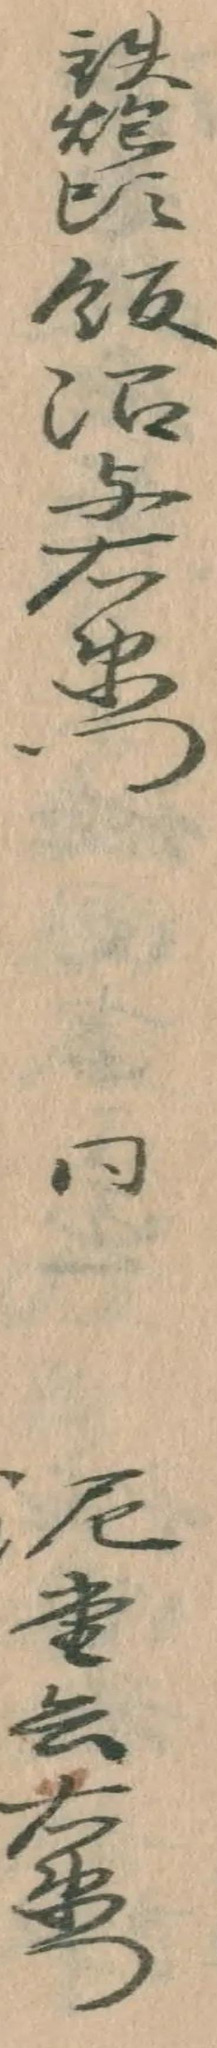鉄炮頭飯沼与右衛門同泥堂兵右衛門
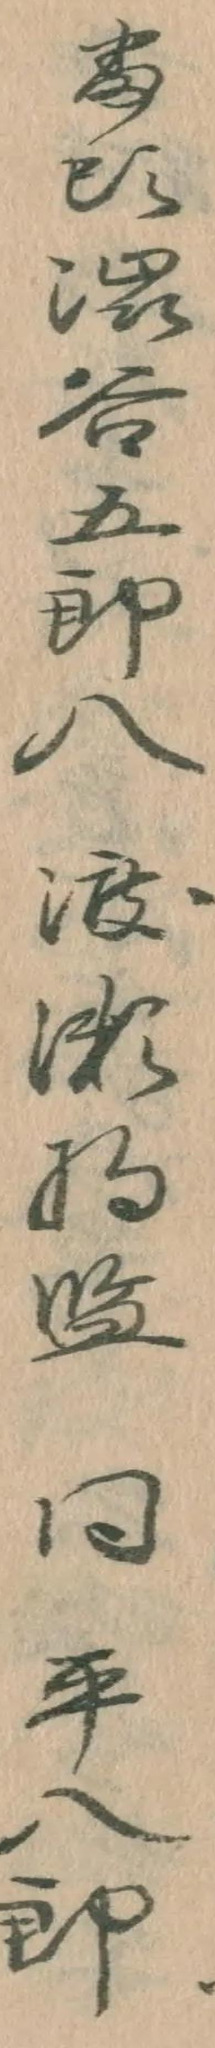番頭渋谷五郎八渡瀬将監同平八郎
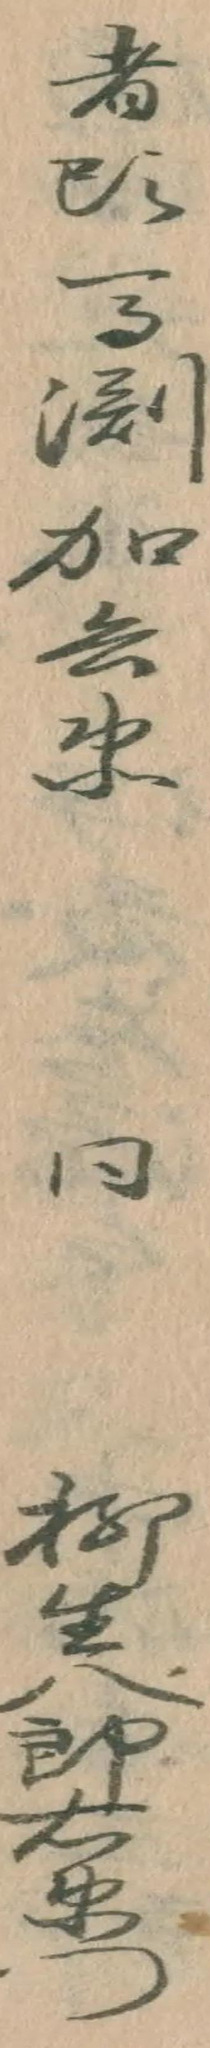者頭馬渕加兵衛同柳生八郎右衛門
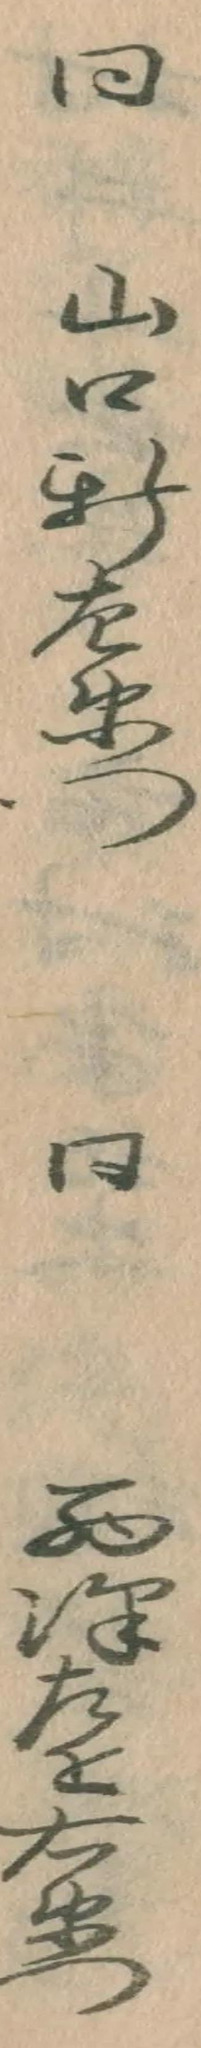同山口新左衛門同西沢左近右衛門
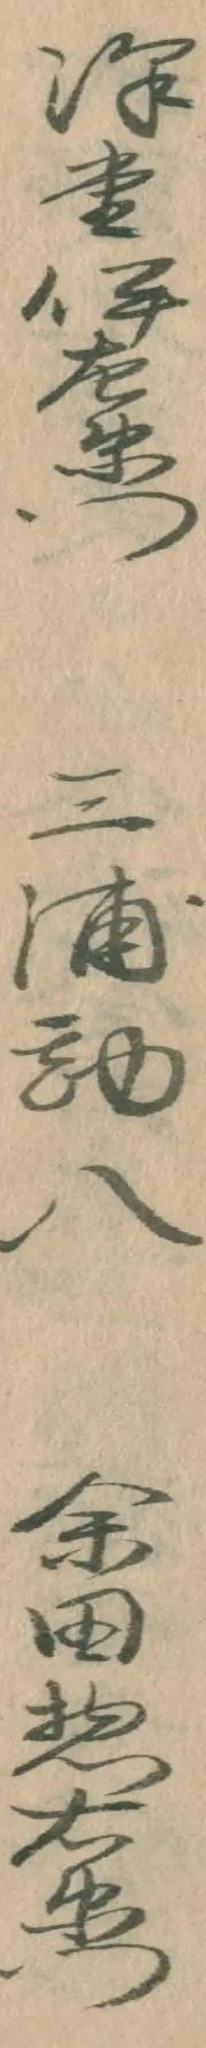沢堂伊左衛門三浦勘八余田惣右衛門
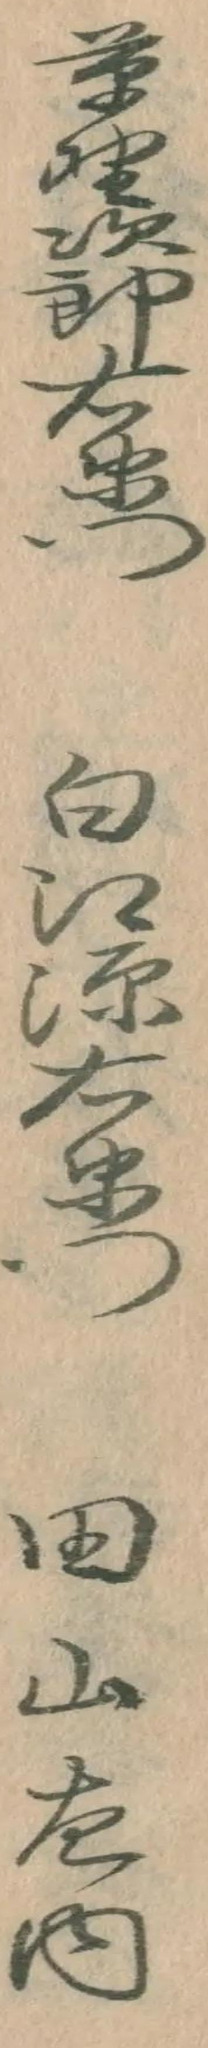草野次郎右衛門白江源右衛門田山左内
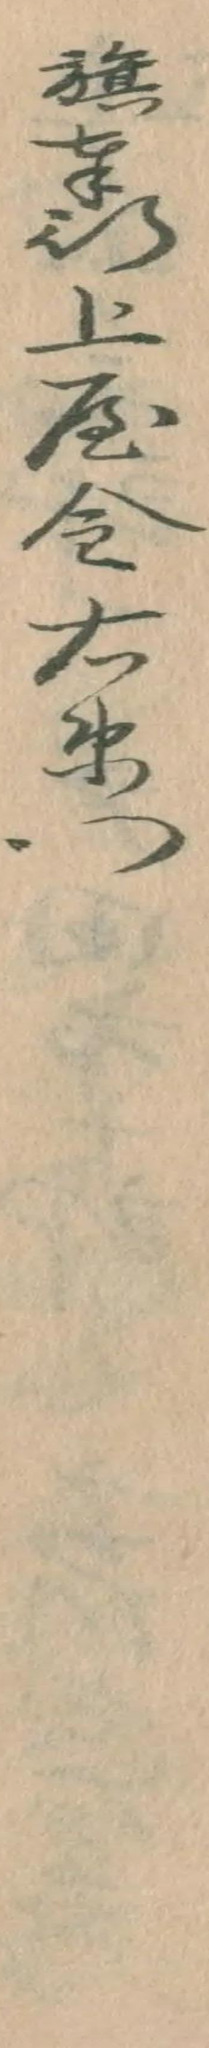旗奉行上屋金右衛門
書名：切支丹御退治記 49巻. [5]
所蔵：国立国会図書館 National Diet Library, JAPAN
